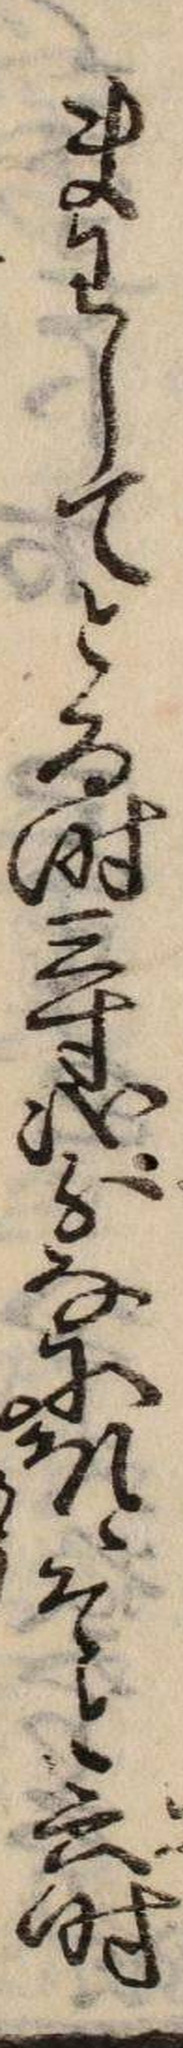まわしてとる時三寸弐分なにほとそと云時
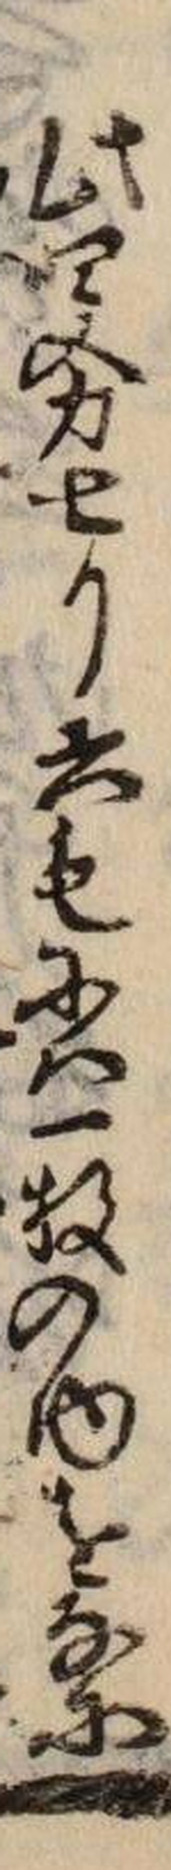此四分七厘六毛には一枚の内をなに
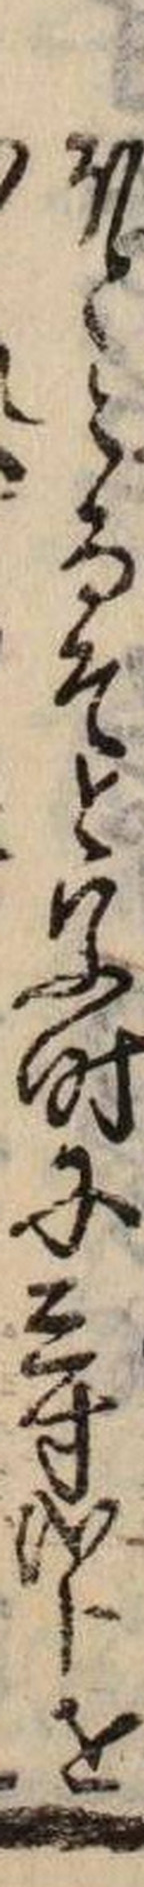ほととるそといふ時に三寸弐分を
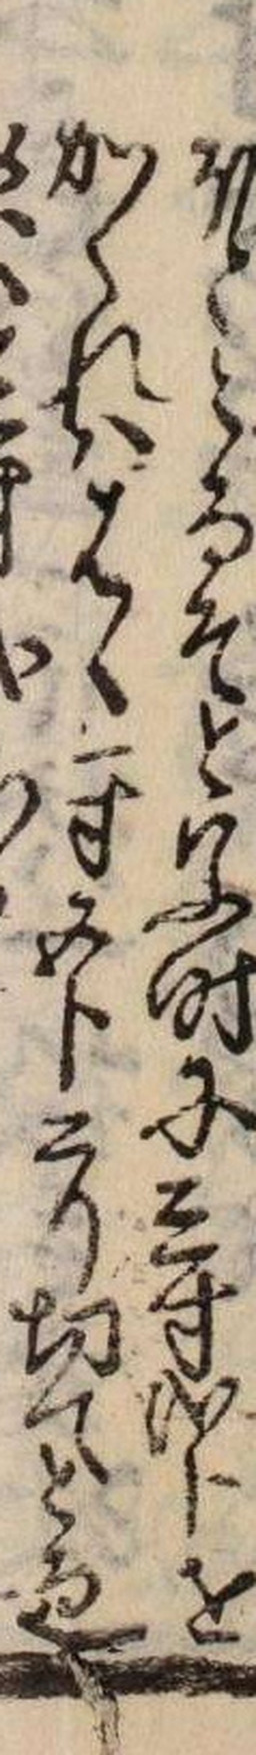かくれははく一寸五分二り切てとる也
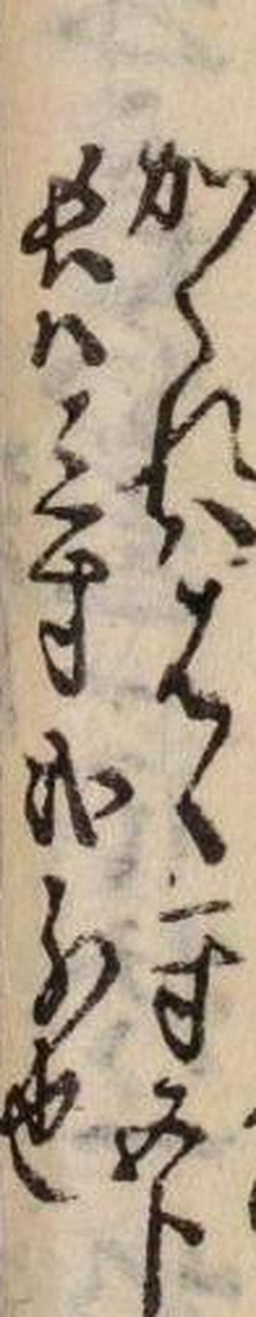長は三寸弐分也
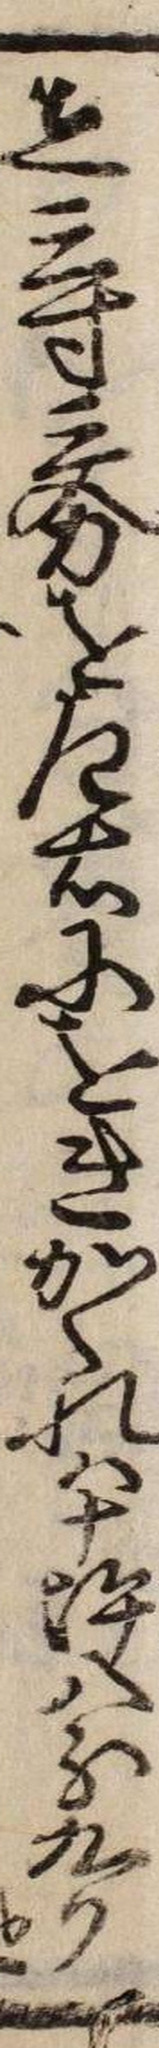先三寸三分を左右にをきかくれは十坪八分九りと
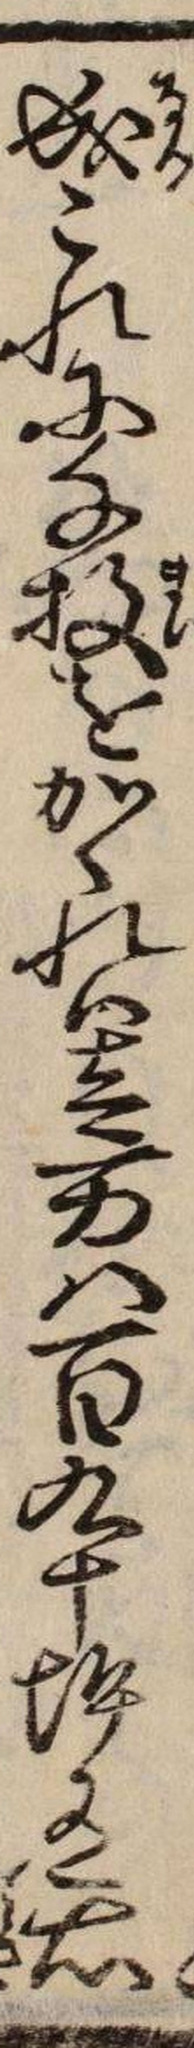成これに千枚をかくれは壱万八百九十坪有右
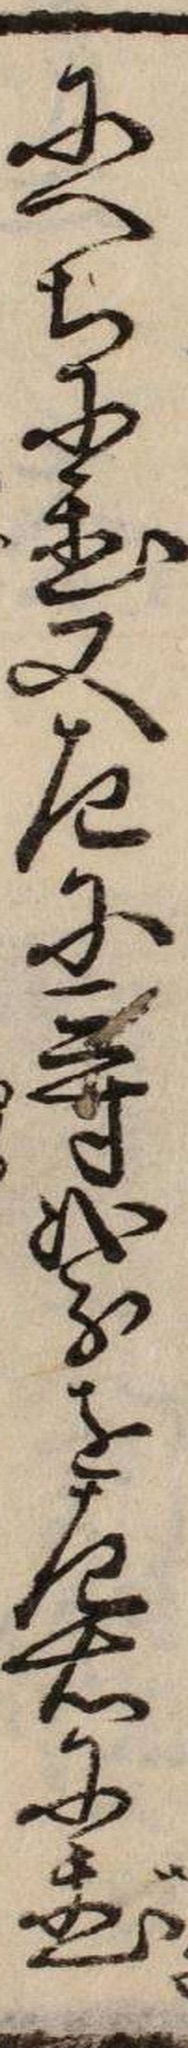にへちに置又左に三寸弐分を左右に置
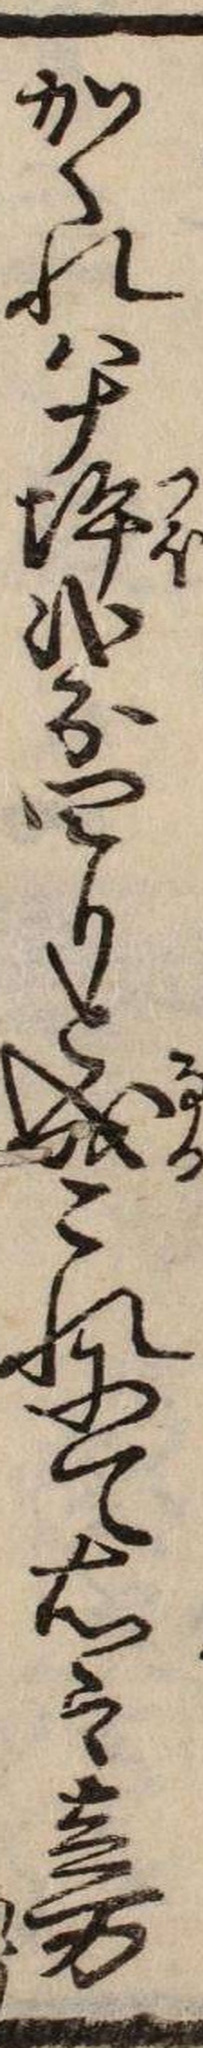かくれは十坪弐分四りと成これにて右の壱万
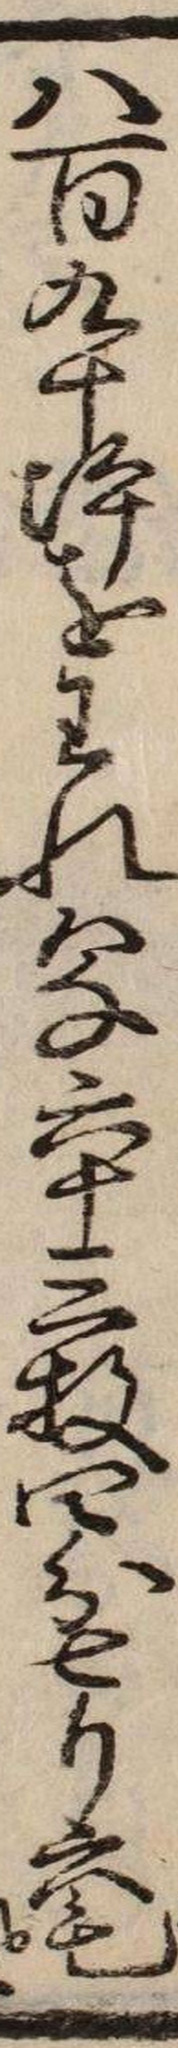八百九十坪をわれは千六十三枚四分七り六毛と
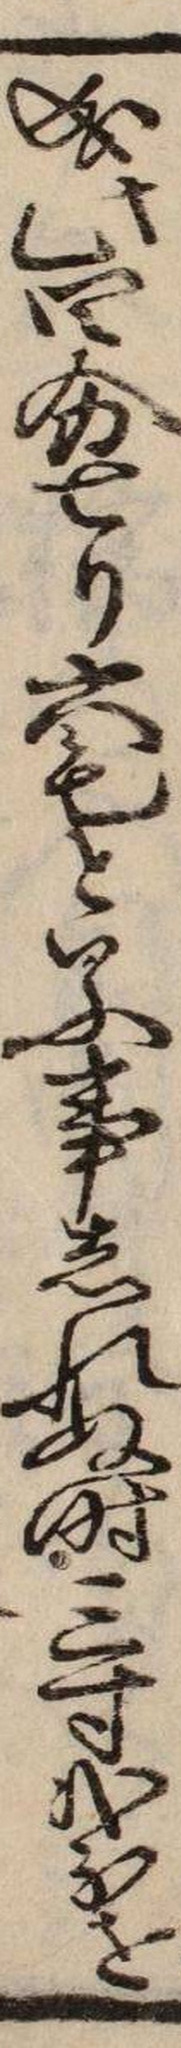成此四分七り六毛といふ事しれぬ時三寸弐分を
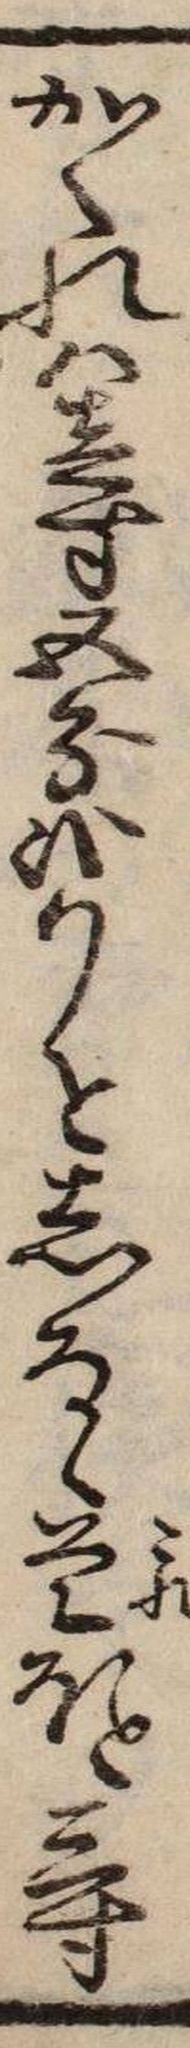かくれは壱寸五分弐りとしるゝ是ほと三寸
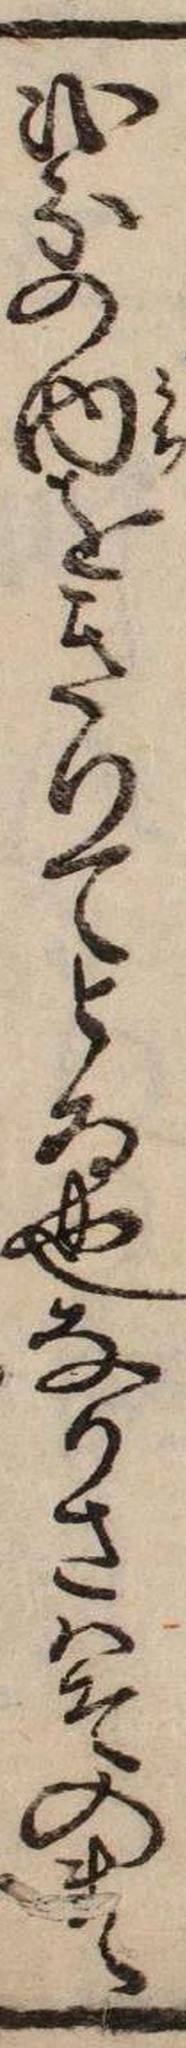弐分の内をきりてとる也なかさはそのまゝ
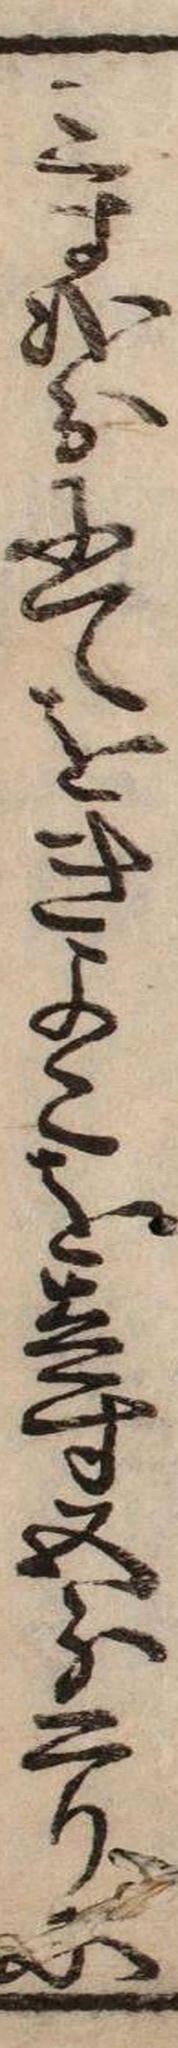三寸弐分にてをきよこを壱寸五分二りに

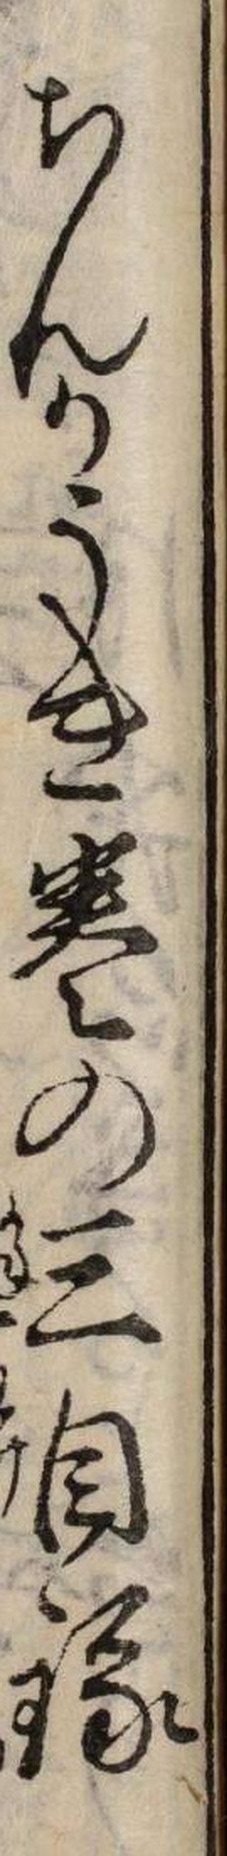ちんかうき巻の三目録
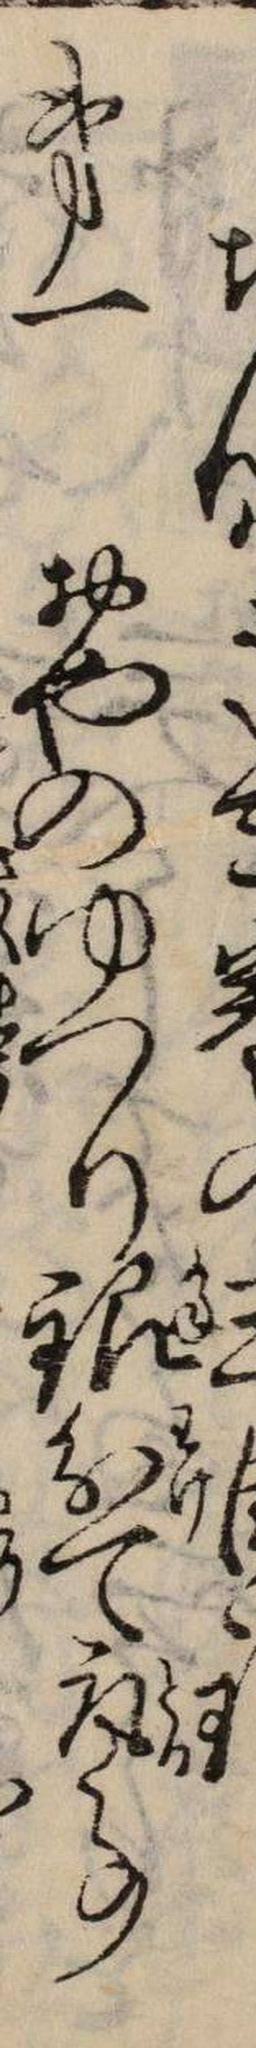第一おやのゆつり銀分て取事
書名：塵劫記（寛永11年自跋、京都府立京都学・歴彩館追貴8）
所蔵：京都府立京都学・歴彩館 国文学研究資料館
